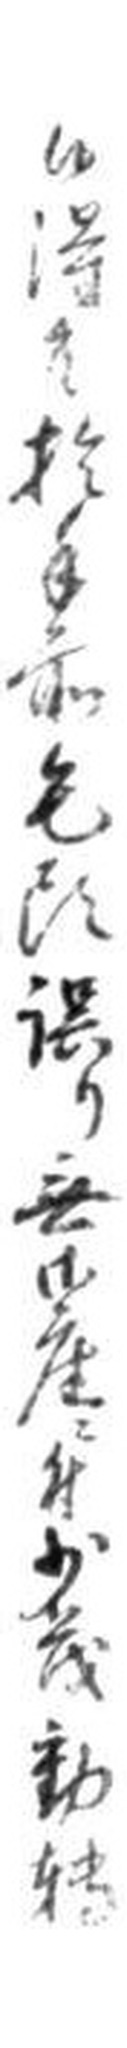候得共於手前毛頭誤り無御座ニ付少茂動転
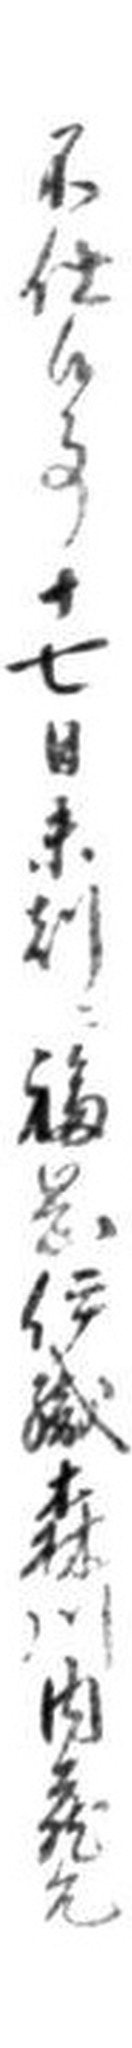不仕候事十七日未刻ニ福岡伊織森川内蔵允
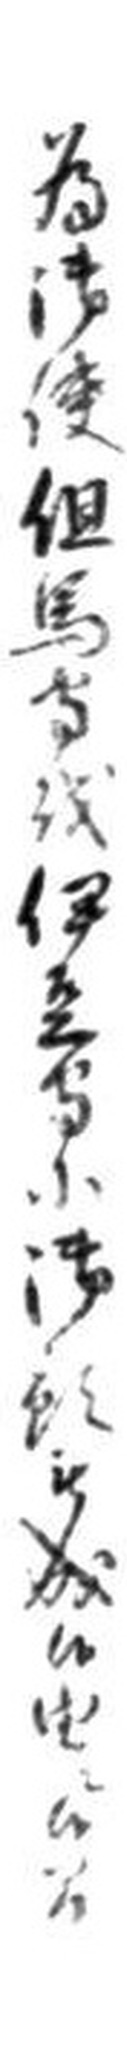為御使但馬守を伊豆守に御預被成候由ニ候間
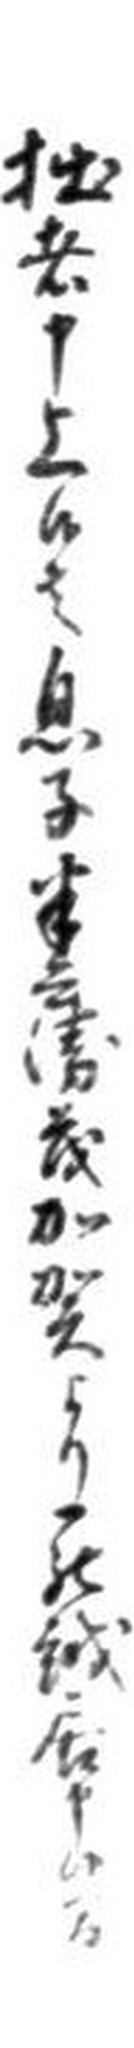拙者申上候者息子半兵衛茂加賀より罷越居申候間
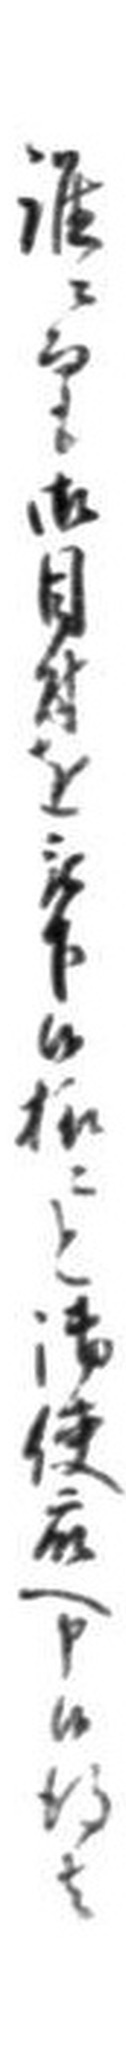誰ニ而も御目付を被下候様ニと御使衆へ申候得者
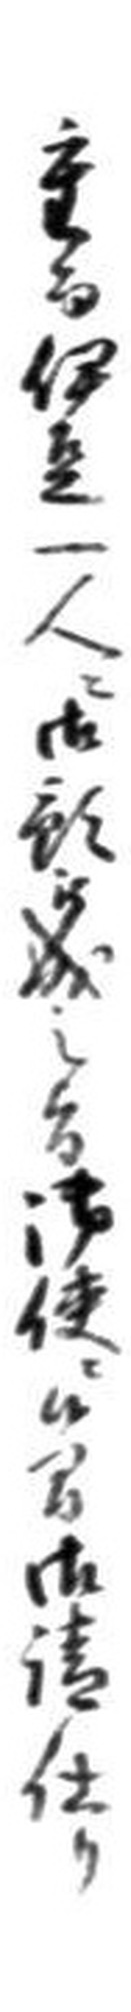重而伊豆一人ニ御預被成之旨御使ニ候間御請仕り
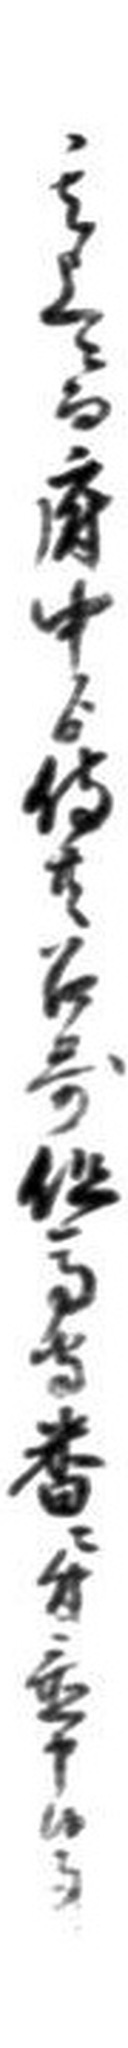其上ニ而府中ゟ侍共召寄但馬守番ニ付置申候事
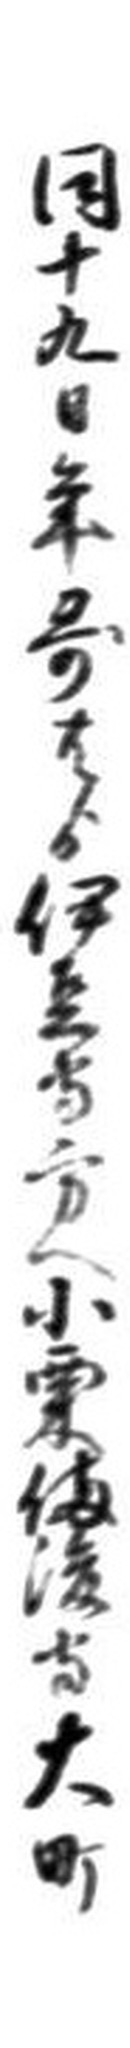同十九日年寄共ゟ伊豆守方へ小栗備後守大町
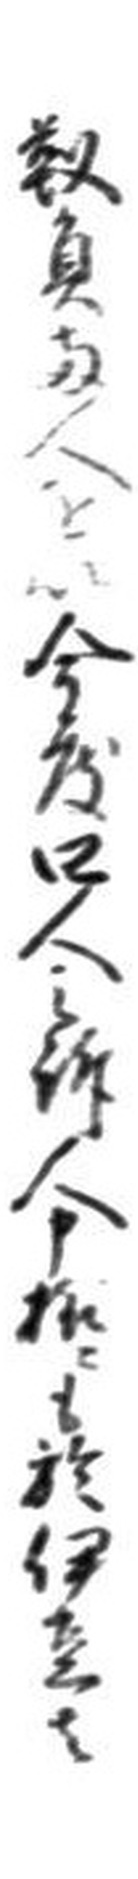靱負両人を以今度四人之訴人申様ニも於伊豆者
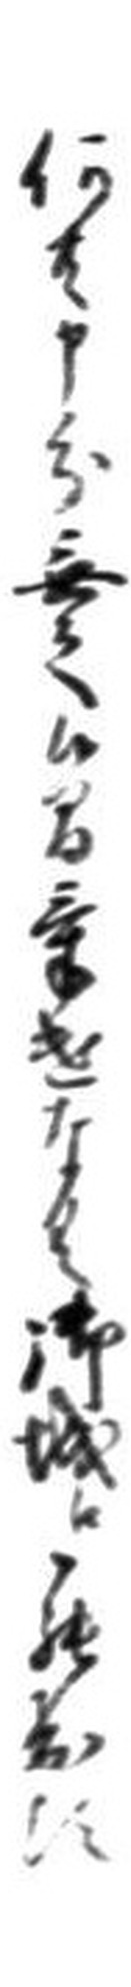何共申分無之候間気遣なく御城江罷出
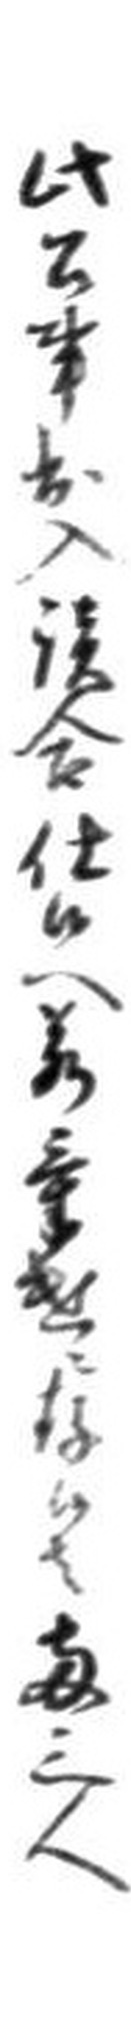此公事出入談合仕候へ若気遣ニ存候者両三人
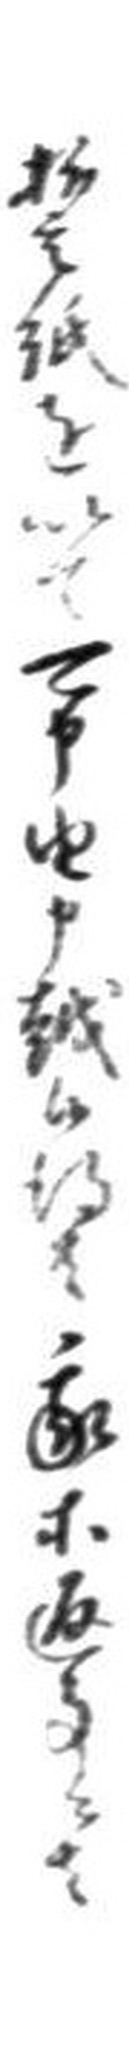誓紙を以て可申由申越候得共我等返事ニ者
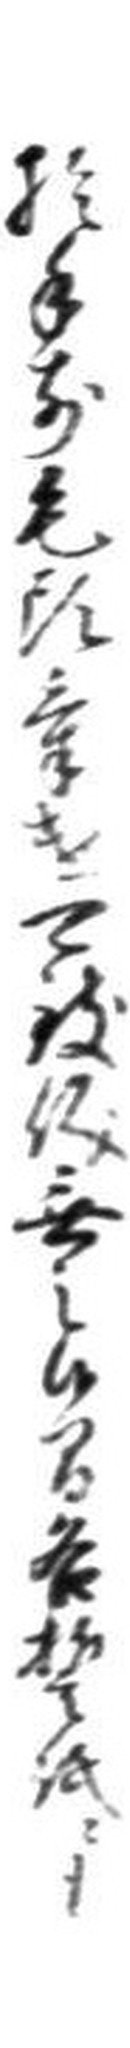於手前毛頭気遣可致儀無之候間各誓紙ニも
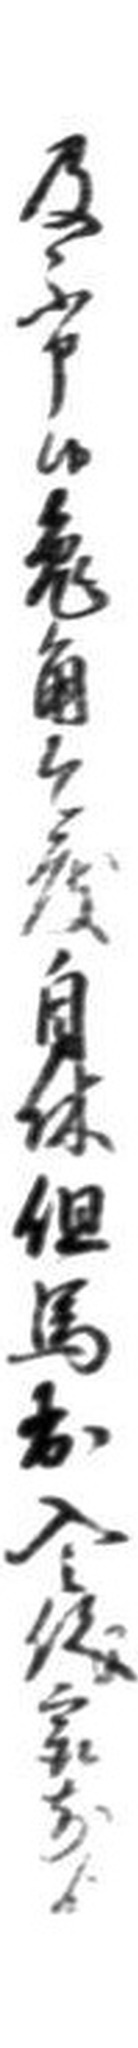及不申候兎角今度自休但馬出入之儀最前ゟ

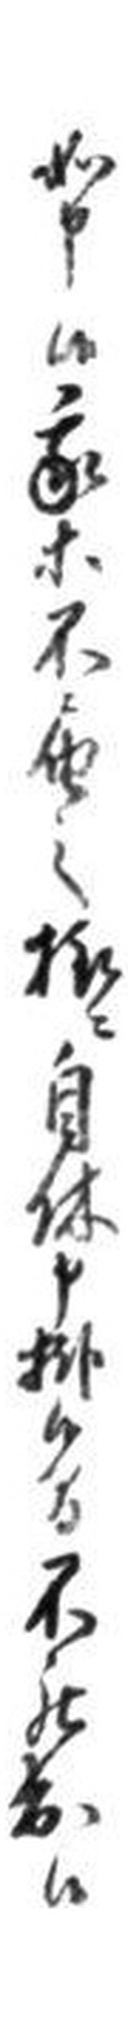如申候我等不届之様ニ自休申掛候間不罷出候
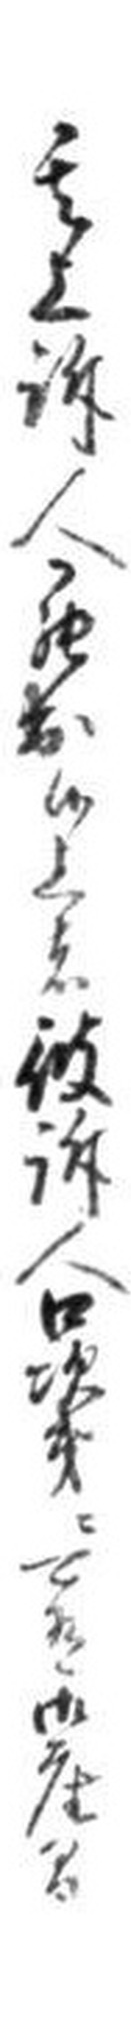其上訴人罷出候上者彼訴人口次第ニ可有御座間
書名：家譜 二 忠直公 従文禄四年到慶安四年
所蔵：福井県文書館 Fukui Prefectural Archives
